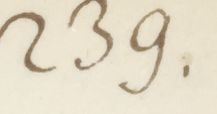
239
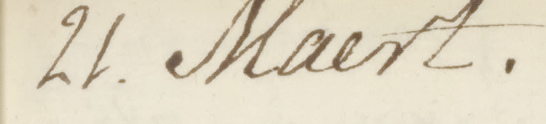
21. Maert.
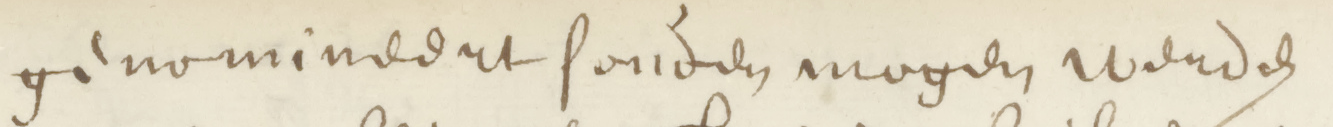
genomineert souden mogen werden
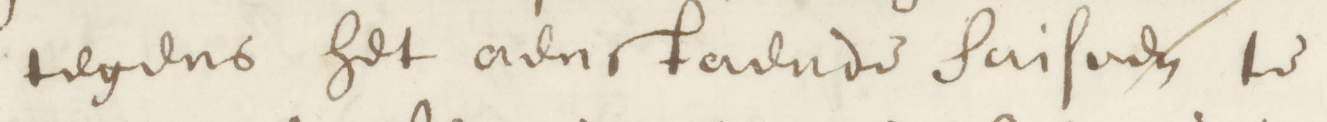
tegens het aenstaende saisoen te
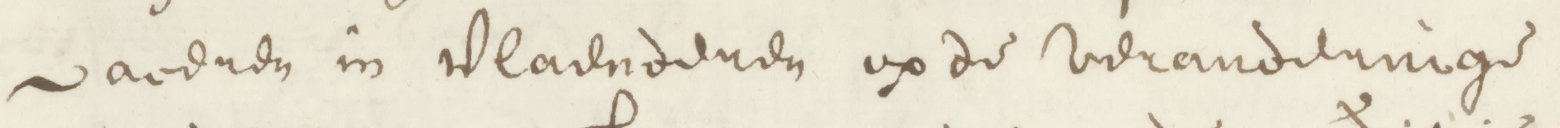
vaceren in Vlaenderen opde veranderinge
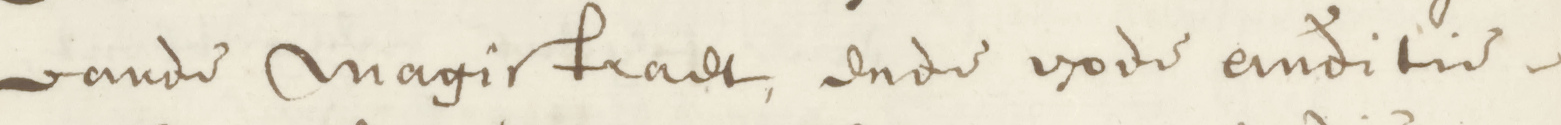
vande Magistraet, ende opde auditie
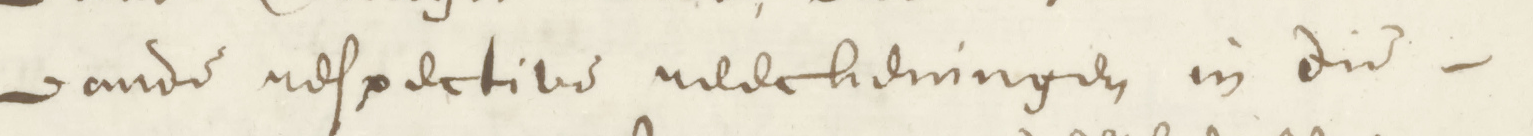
vande respective reeckeningen in die —
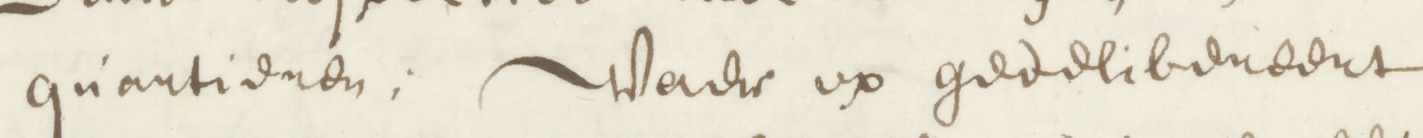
quartieren: Waer op gedelibereert
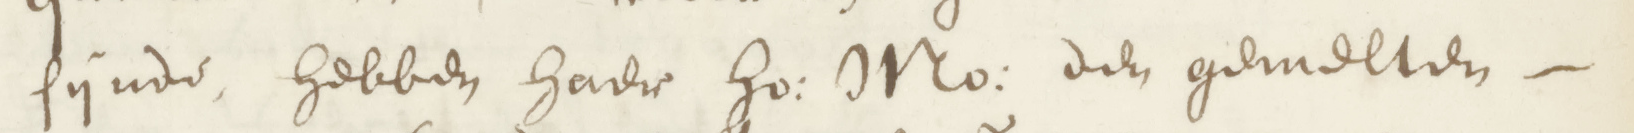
sijnde, hebben haer ho:Mo: den gemelten —
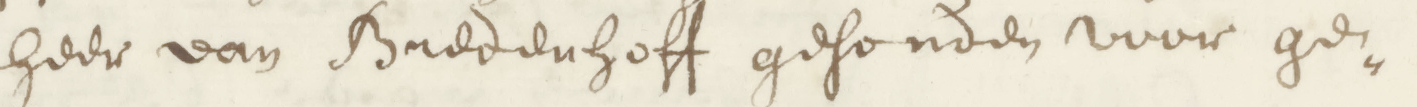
heer van Bredenhoff gesonden voor ge„
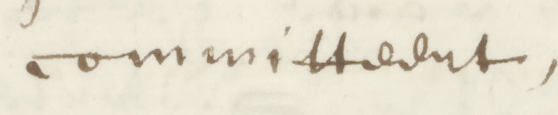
committeert.
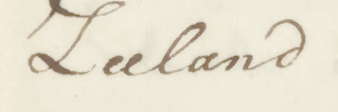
Zeeland
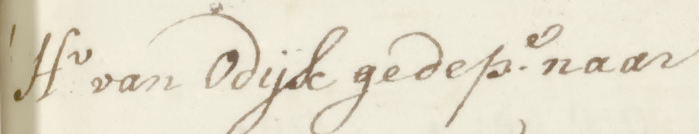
Hr van Odijk gedepue naar
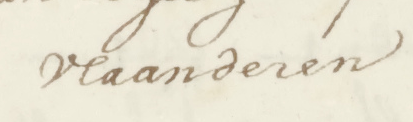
Vlaanderen
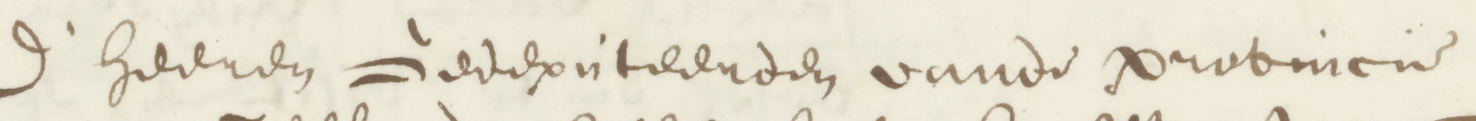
D‛heeren Gedeputeerden vande provincie
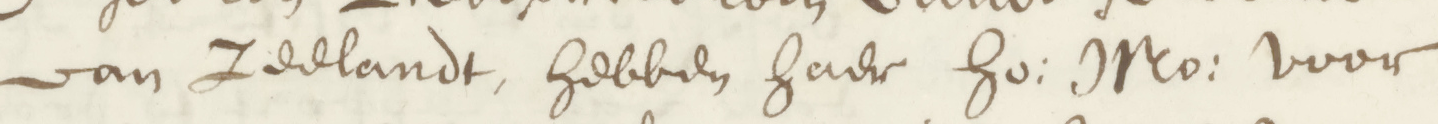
van Zeelandt, hebben haer ho:Mo: voor
